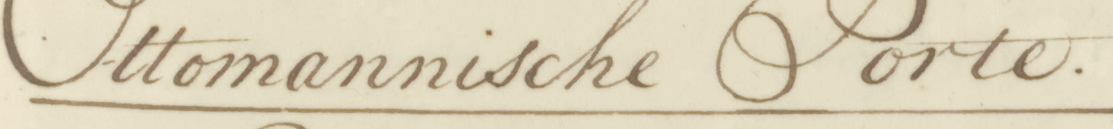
Ottomannische Porte.
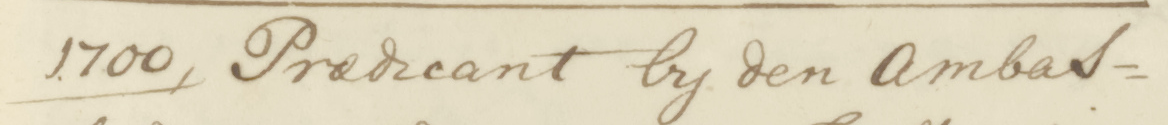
1700, Predicant bij den ambas„
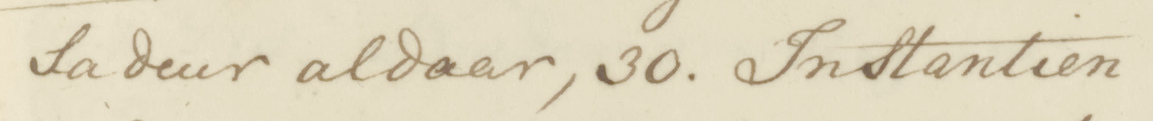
sadeur aldaer, 30. Instantien
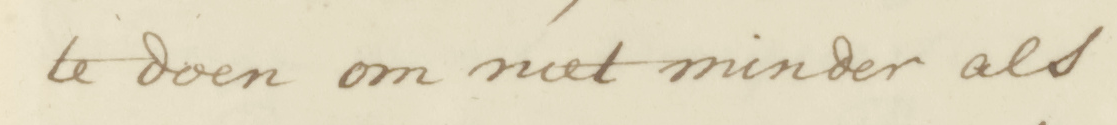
te doen om niet minder als
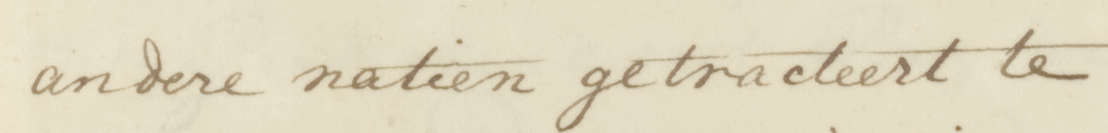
andere natien getracteert te
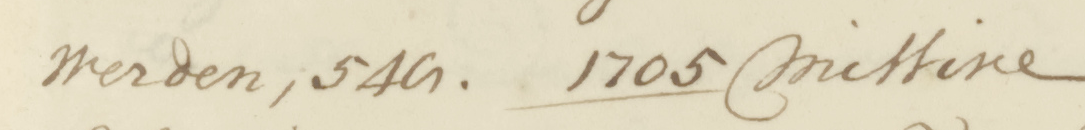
werden, 548. 1705 Missive
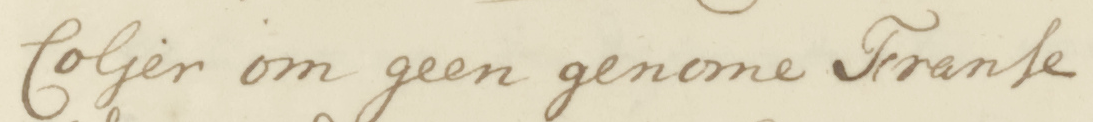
cohier om geen genome Franse
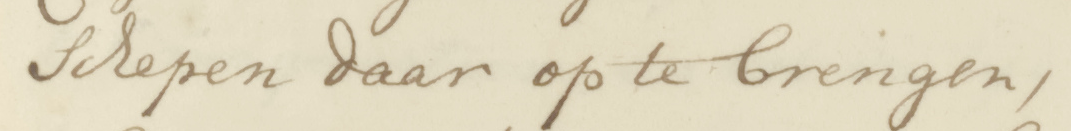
schepen daer op te brengen,
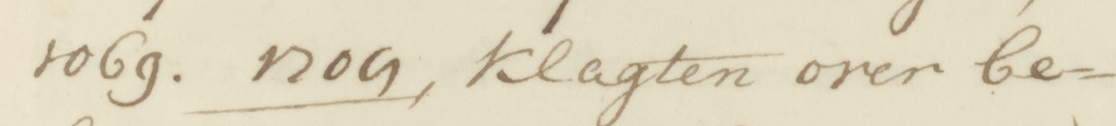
1069. 1708, Klagten over be„
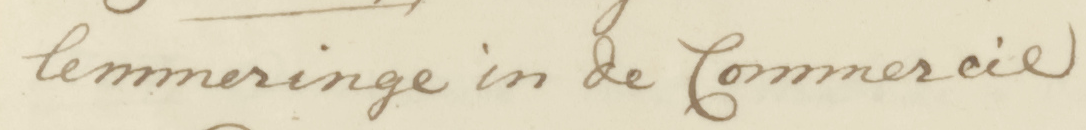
lemmeringe in de Commercie
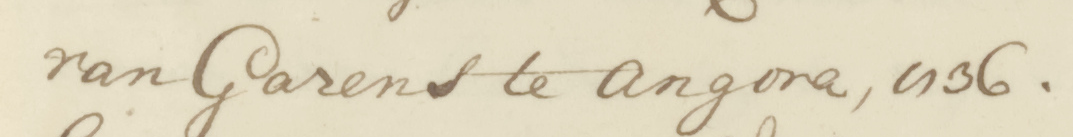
van Garens te Angora, 836.
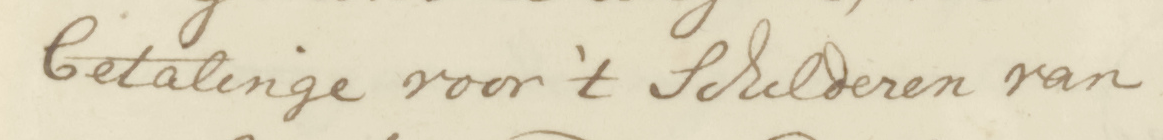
betalinge voor 't schilderen van
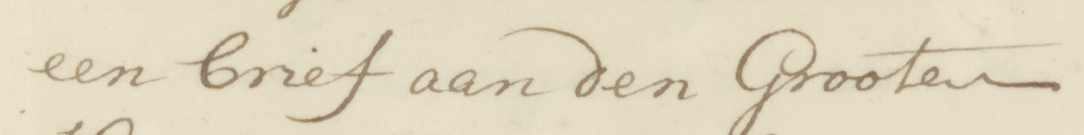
een brief aan den Grooten
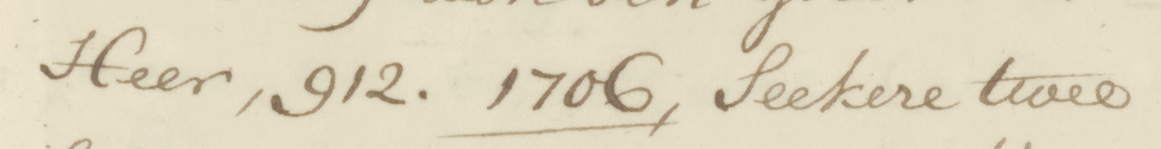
Heer, 912. 1706, Seekere twee
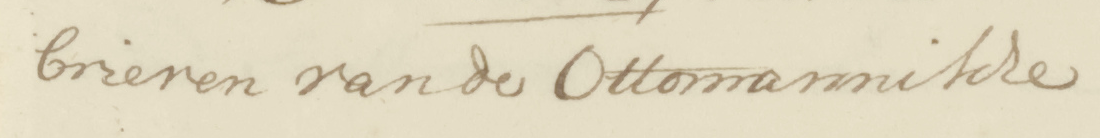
brieven van de Ottomannische
